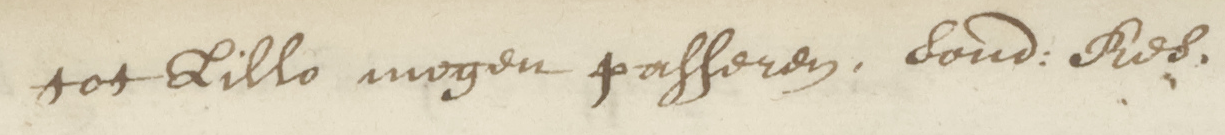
tot Lillo mogen passeren, sond: Res.
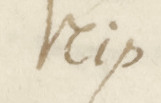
kip
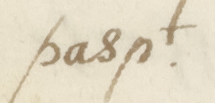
paspt.
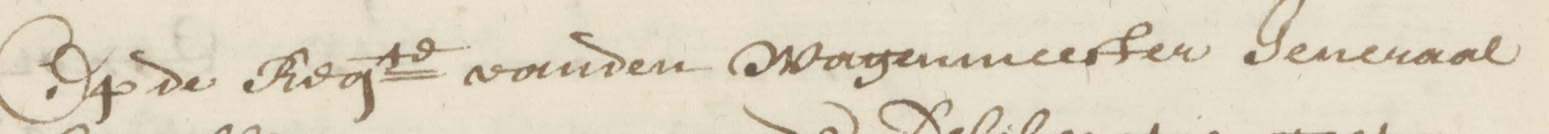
Opde Reqte vanden Wagenmeester Generaal
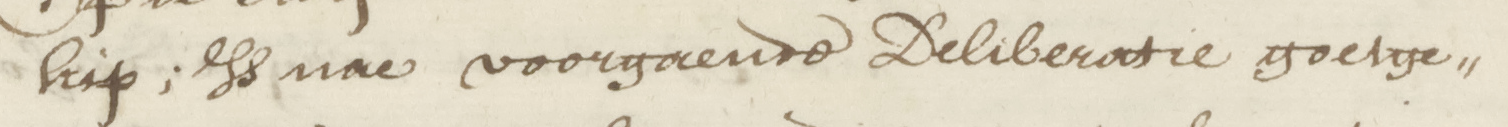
Kip: Is nae voorgaende Deliberatie goetge„
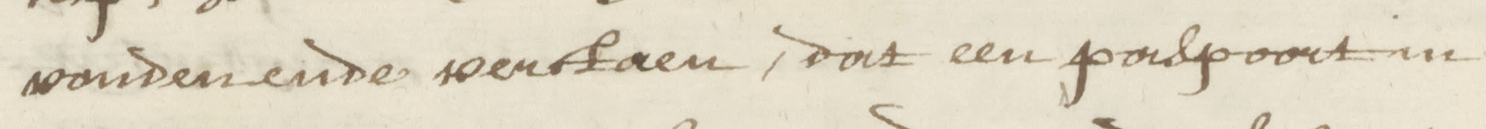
vonden ende verstaen, dat een paspoort in
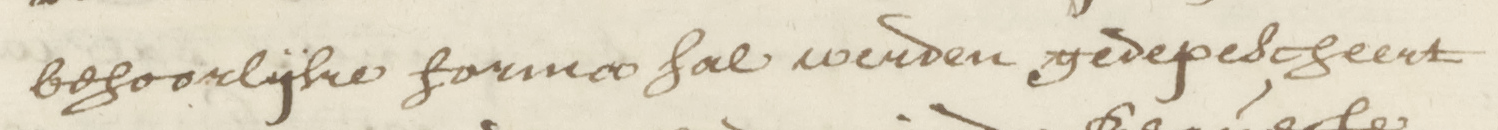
behoorlijke forma sal werden gedepescheert
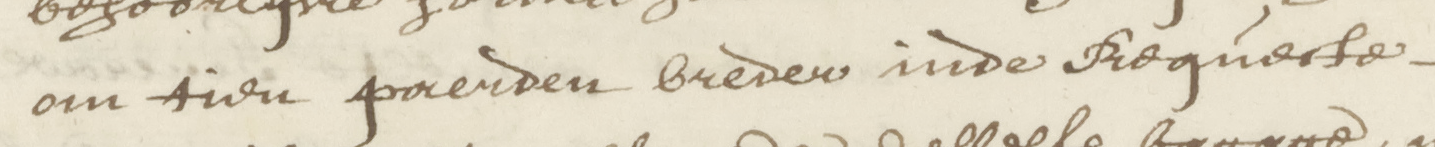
om tien paerden breder inde requeste
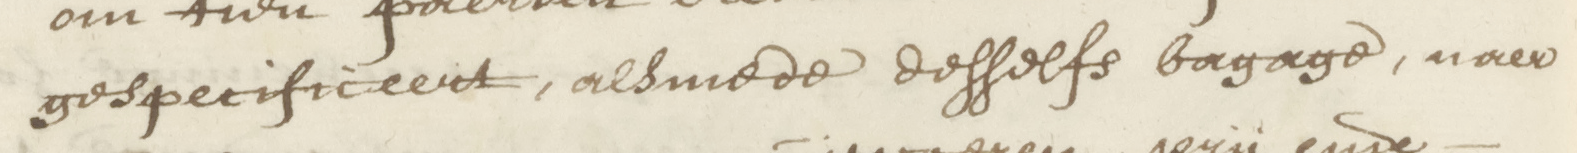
gespecificeert, alsmede desselfs bagage, naer
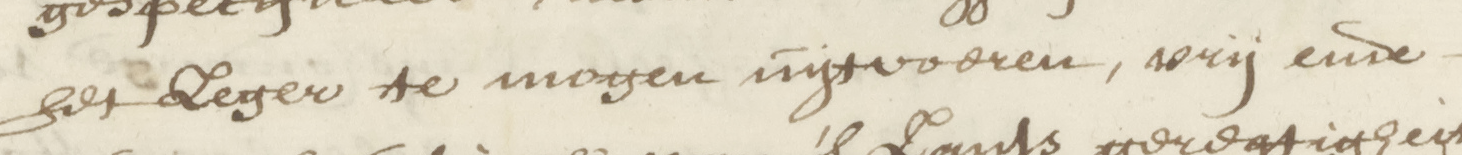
het Leger te mogen uijtvoeren, vrij ende
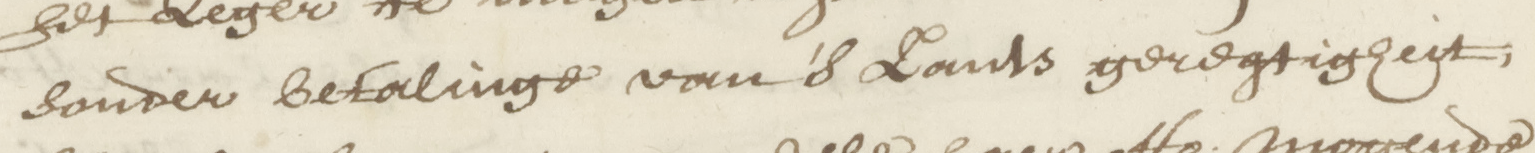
sonder belalinge van ‛s Lants geregtigheijt.
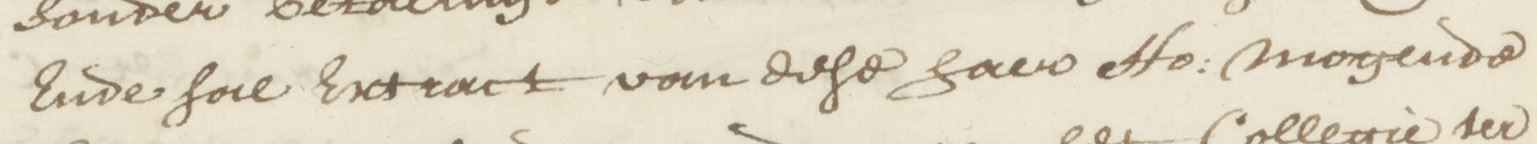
ende sal Extract van dese haer Ho:mogende
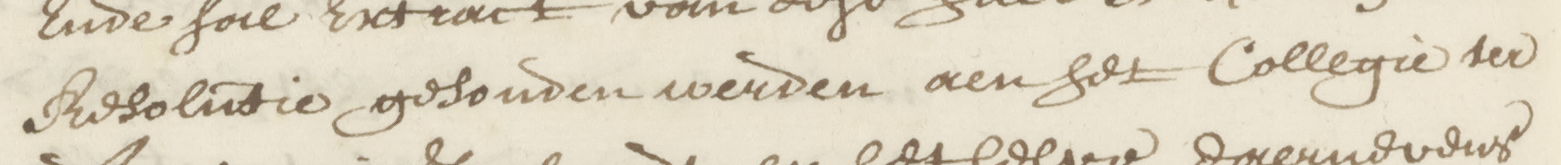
Resolutie gesonden werden aen het Collegie ter
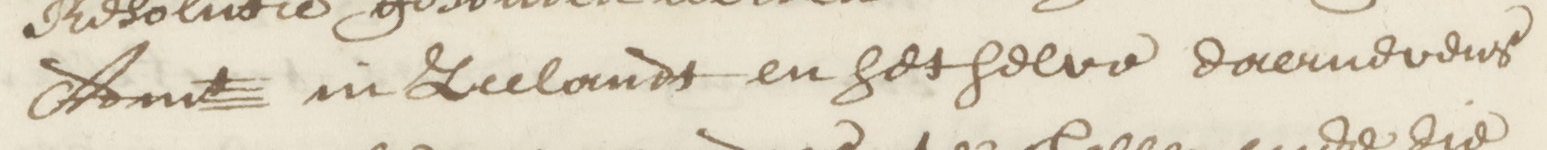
Admt in Zeelandt en het selve daernevens
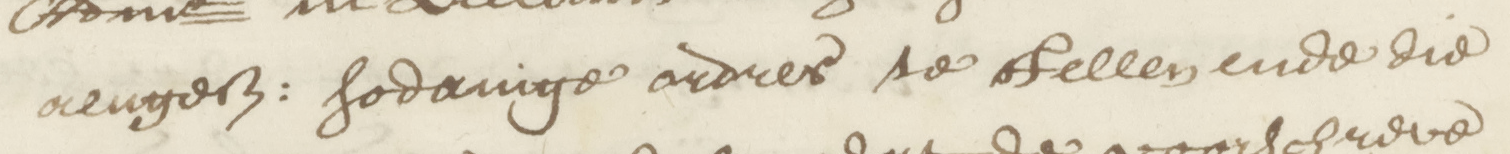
aenges: sodanige ordres te stellen ende die
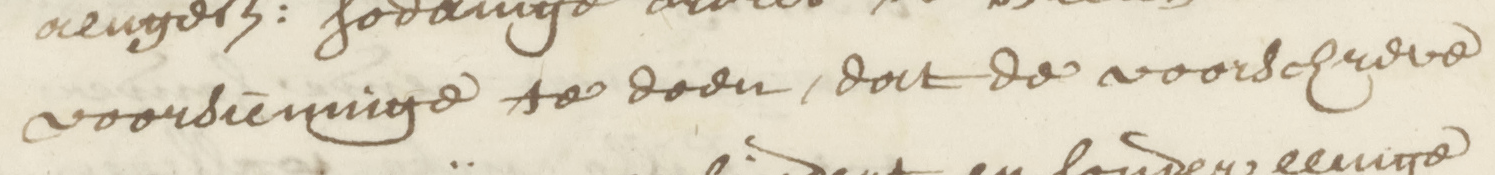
voorsieninge te doen, dat de voorschreve
